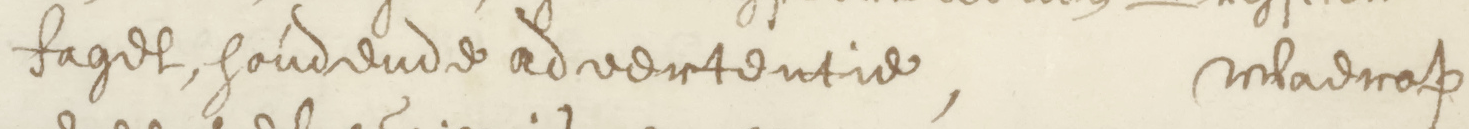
fagel, houdende advertentie. Waerop
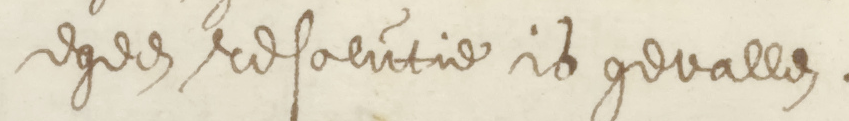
egeen resolutie is gevallen.
